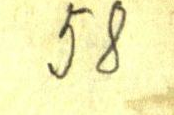58
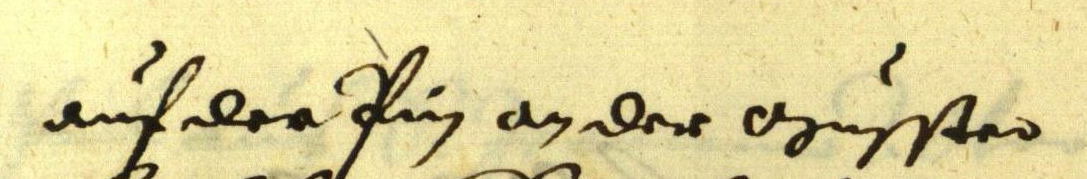aūf der Pin an der Mūsster
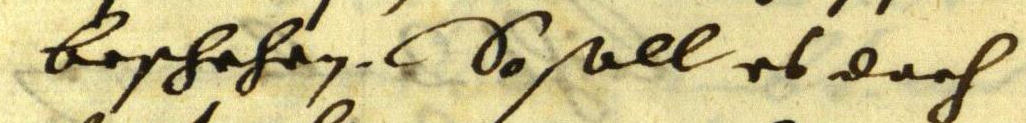beschehen. So soll es doch
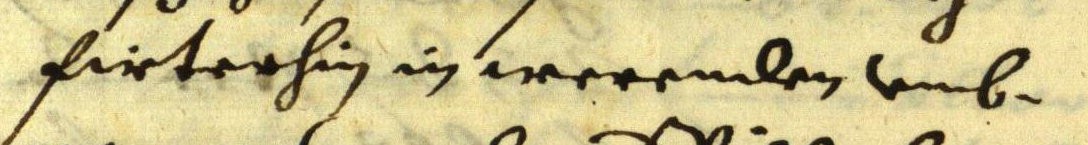firterhin in werenden vmb¬
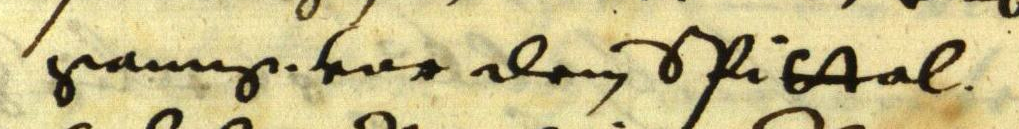ganng. vor dem Spittal.
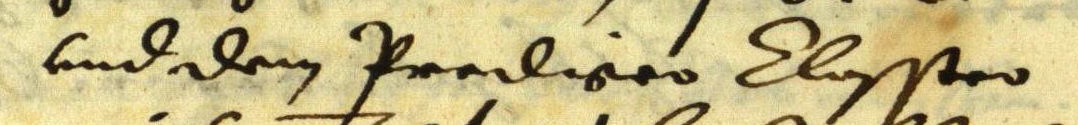vnd dem Prediger Closster
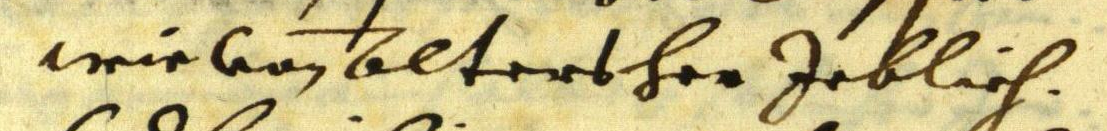wie von Alters her Jeblich.
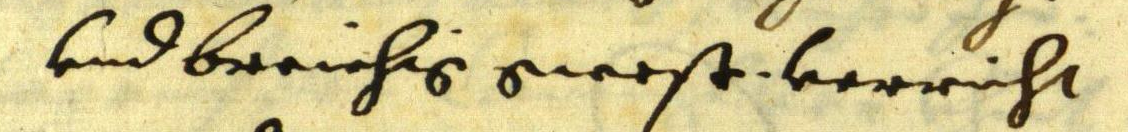vnd breichig gwest. verricht
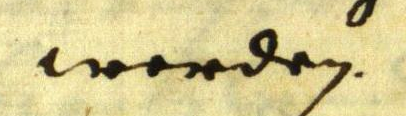werden.
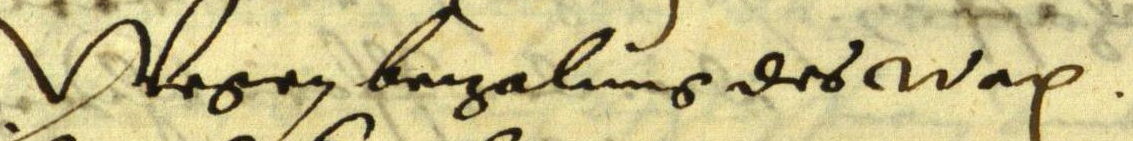Wegen bezalūng des Wax
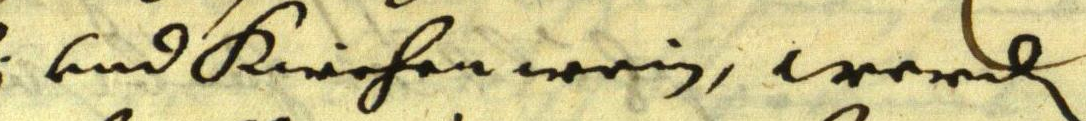vnd Kirchenwein, werd
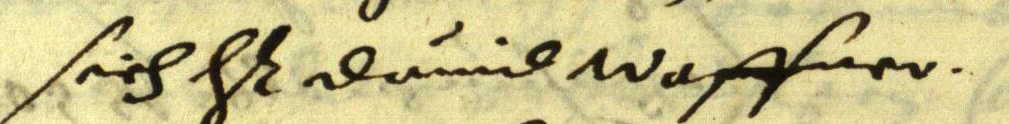sich hl Daūid Waffner.
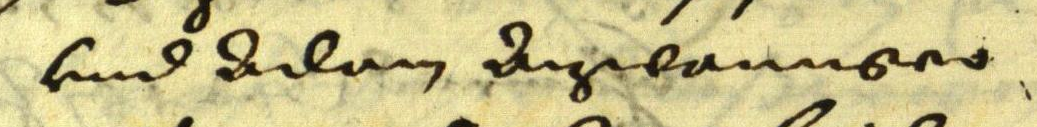vnd Adam Azwannger
